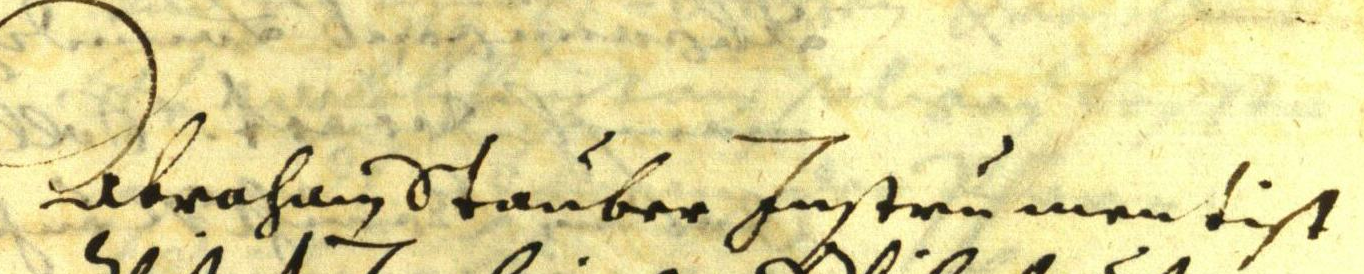Abraham Staūber Instrūmentist
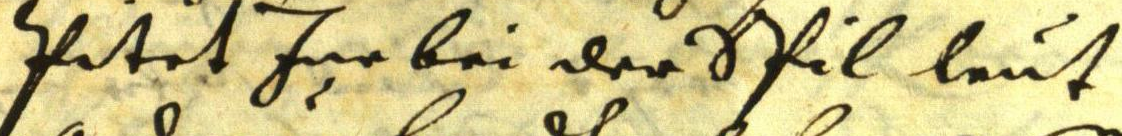Pitet Ine bei der SPil leūt
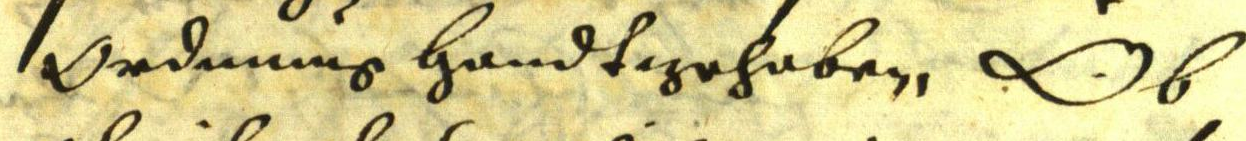Ordnūng Handtzehaben, Ob
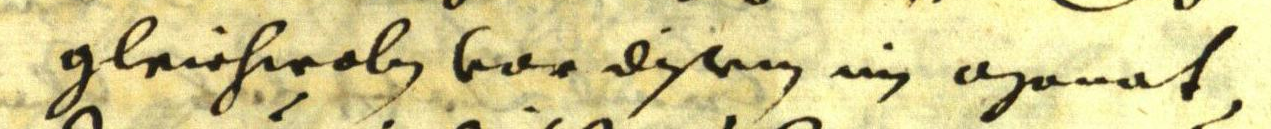gleichwoln vor diesem im Monat
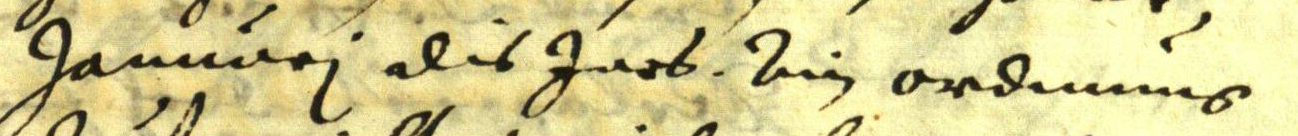Janūarj dis Jars, Ain Ordnūng
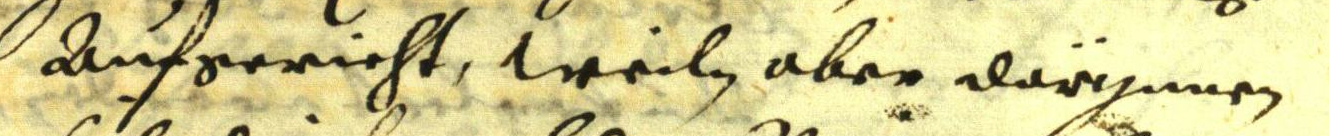Aūfgericht, weiln aber darÿnnen
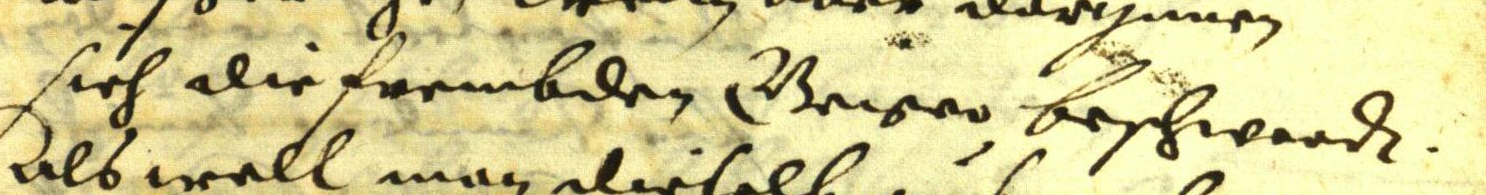sich die frembden Geiger beschwerdt.
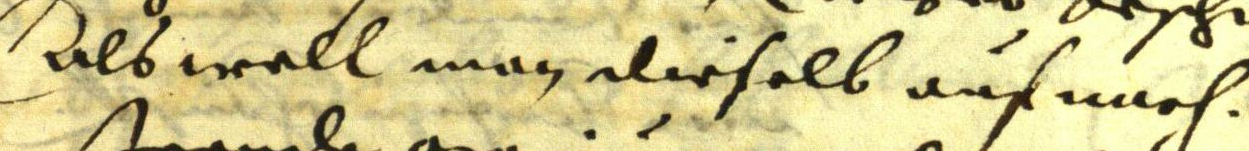Als well man dieselb aūf nach¬
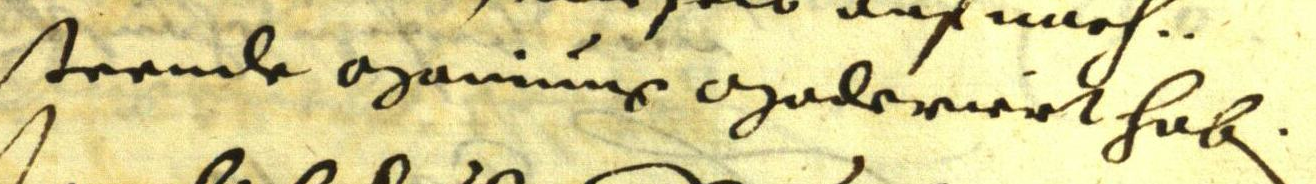steende Mainūng Moderiert hab.
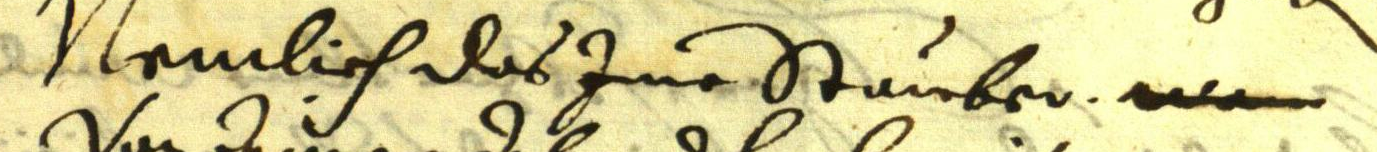Nemlich das Ime Staūber man
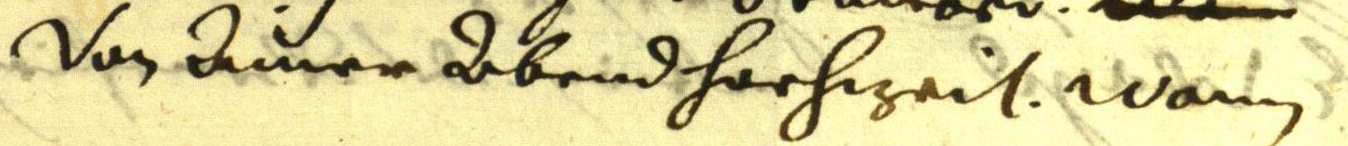Von Ainer Abendhochzeit. wann
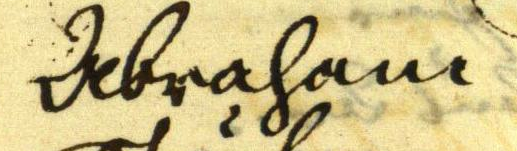Abraham
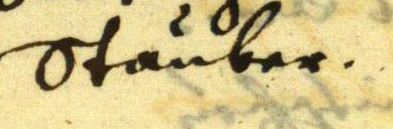Staūber.
